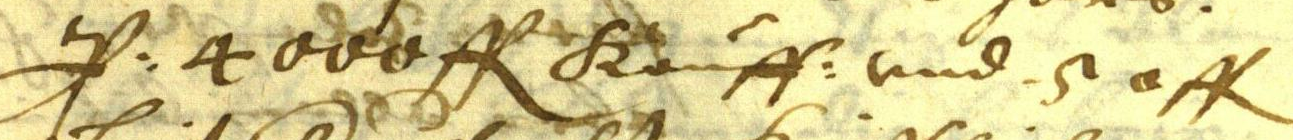P: 4000 fl Kaūff: vnd .50 fl
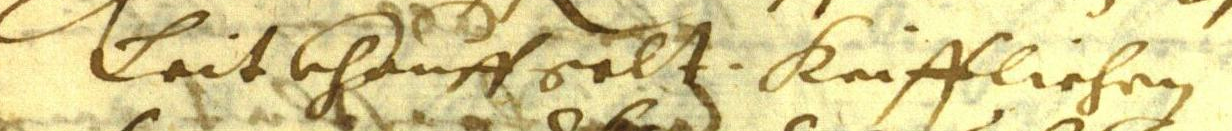Leit khaūff gelt. Keifflichen
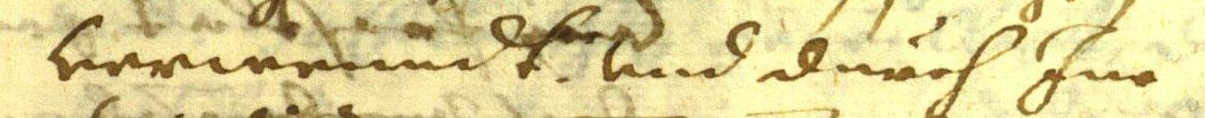verwenndt. vnd dūrch Ine
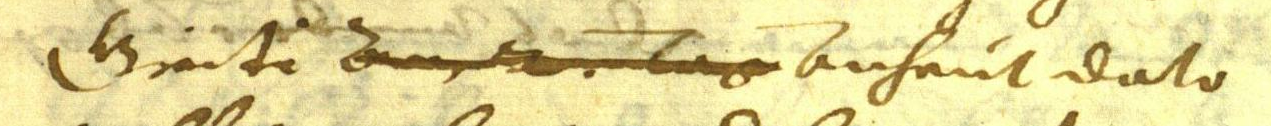Griti Am 21. Tag Anheūt dato
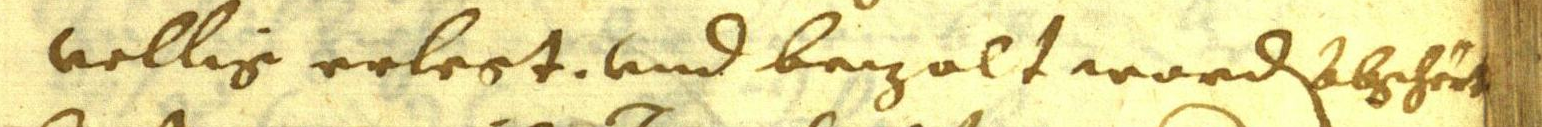vellig erlegt. vnd bezalt word Abgehört.
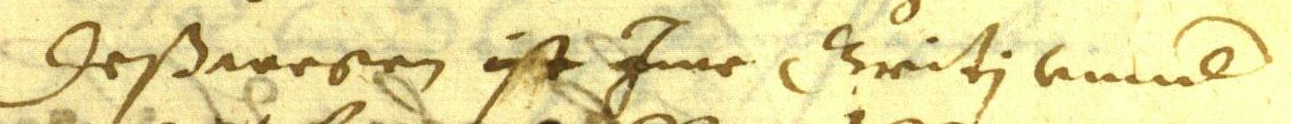Deßwegen ist Ime Gritj vnnd
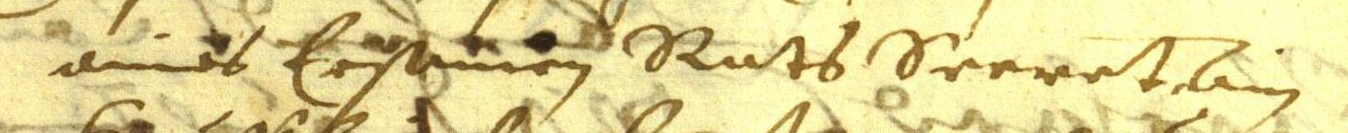aines Ersamen Rats Secret. Ain
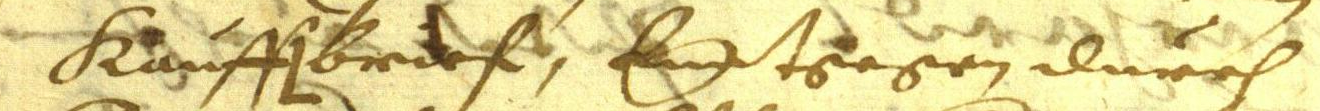Kaūff brief, Enntgegen dūrch
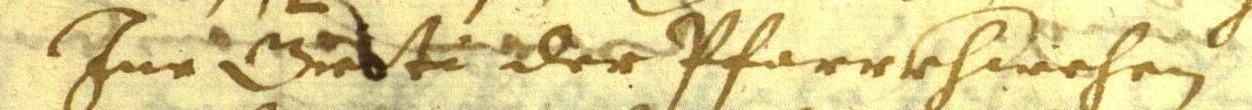Ine Griti der Pfarrkhirchen
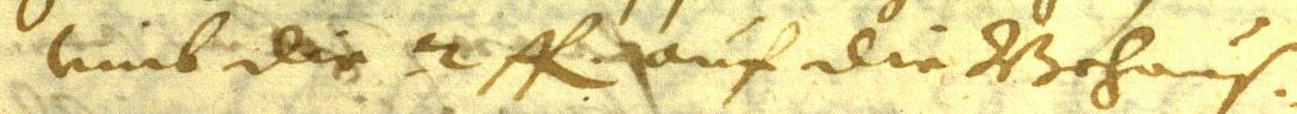vmb die 2 fl. aūf die Behaūs¬
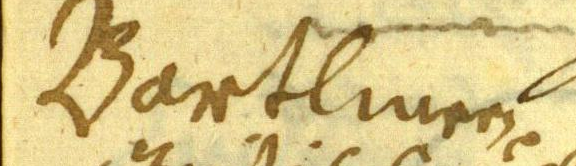Bartlmeen
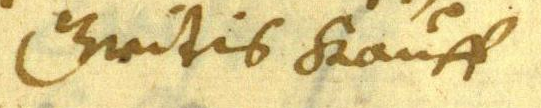Gritis Kaūff
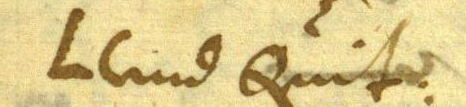vnd Qūit¬
